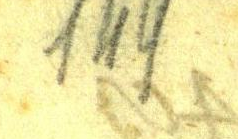149
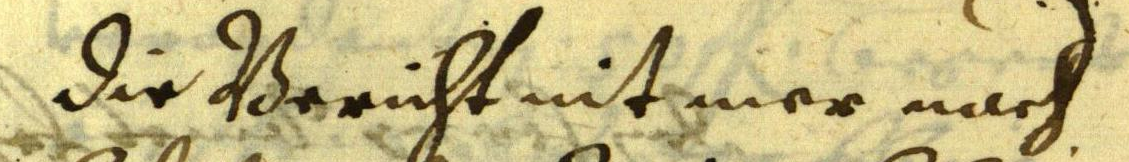die Bericht nit mer nach
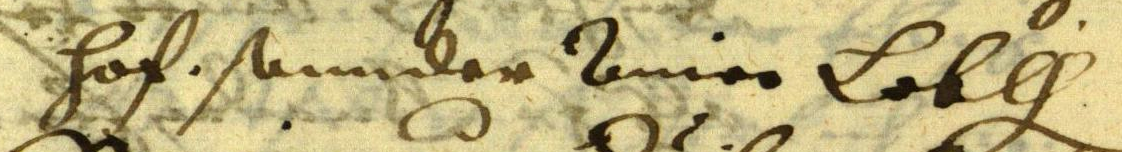hof. sonnder Ainer Lobl
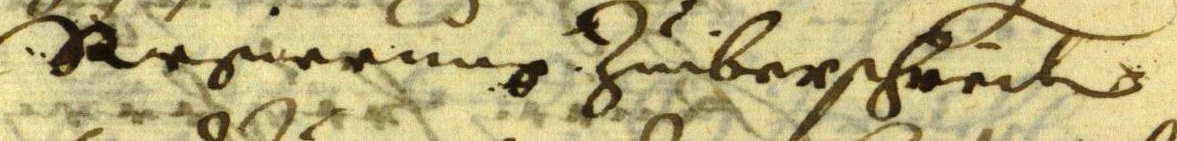Regierūng Zūiberschickh
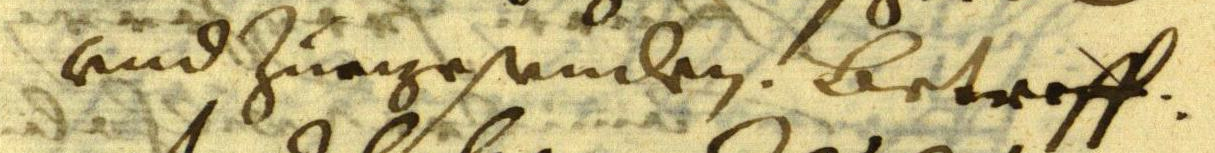vnd Zūezesenden. Betreff¬
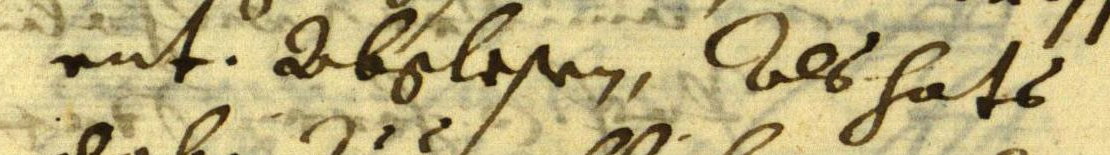ent. Abglesen, Als hats
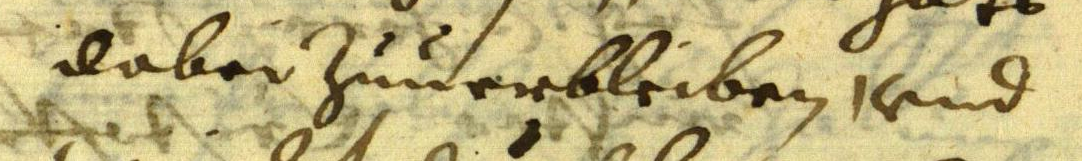dabei Zūūerbleiben, vnd
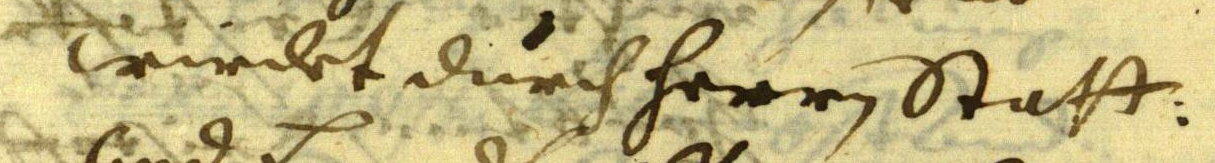wirdet dūrch herrn Statt¬
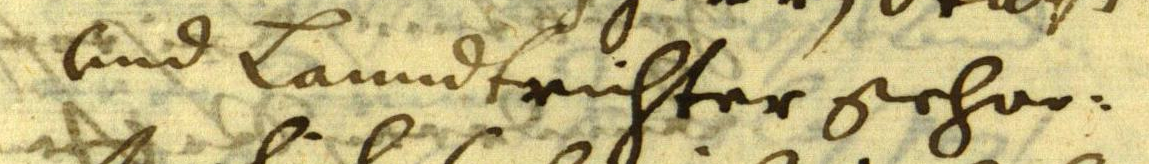vnd Lanndtrichter gehor¬
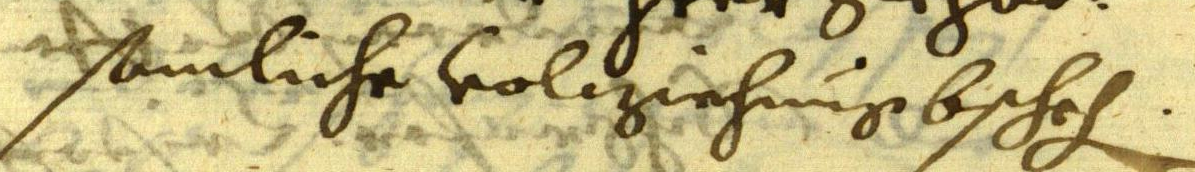samliche volziehūng bscheh.
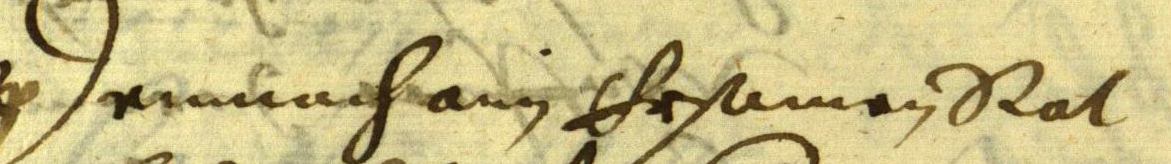Demnach aim Ersamen Rat
